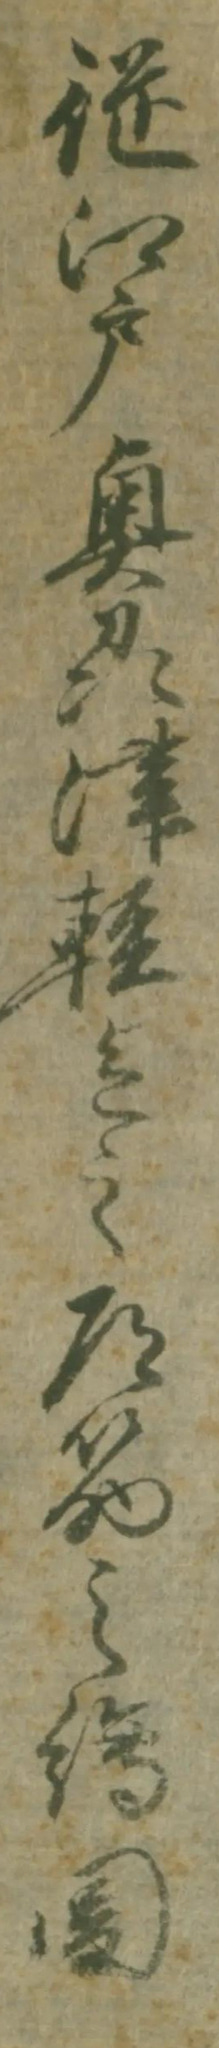従江戸奥州津軽迄之道筋之絵図

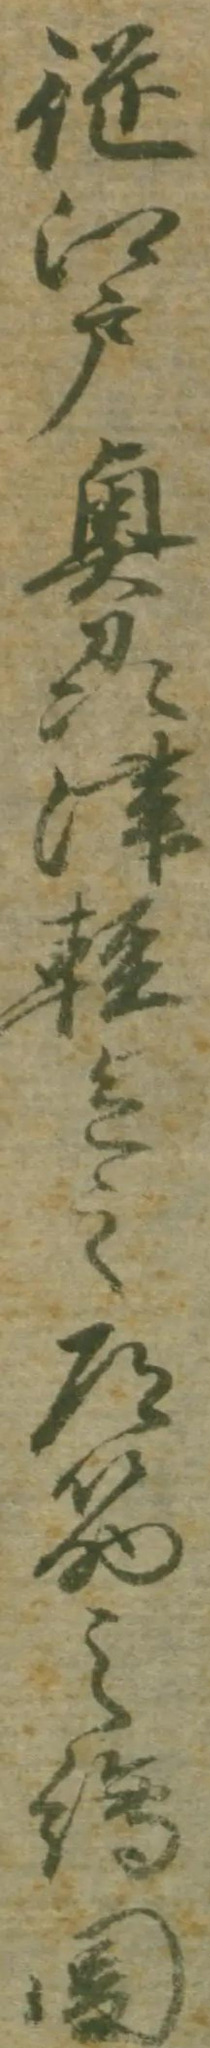従江戸奥州津軽迄之道筋之絵図

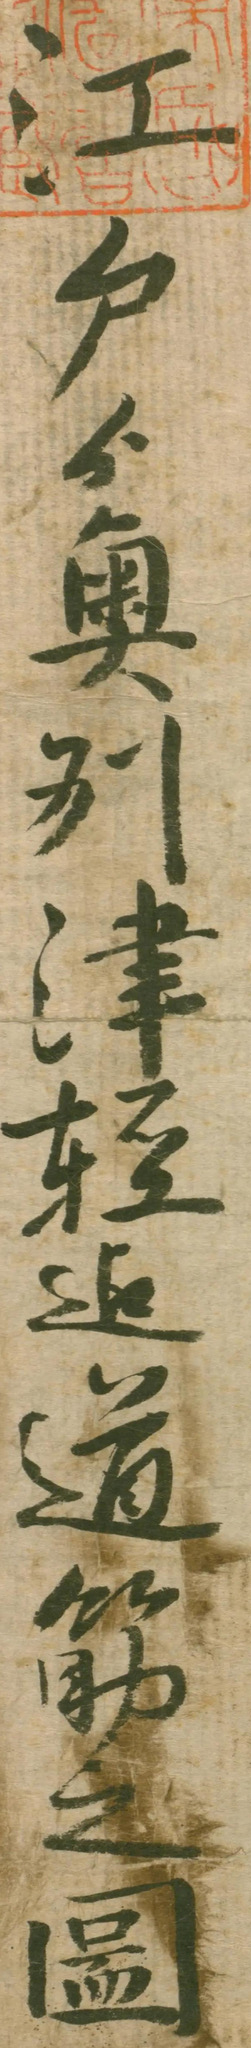江戸より奥州津軽迄道筋之図

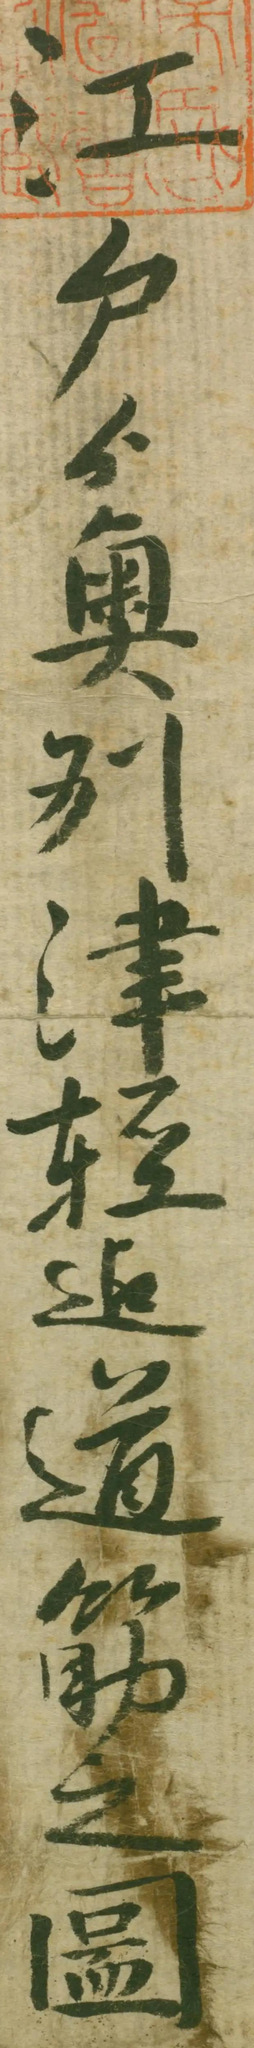江戸より奥州津軽迄道筋之図

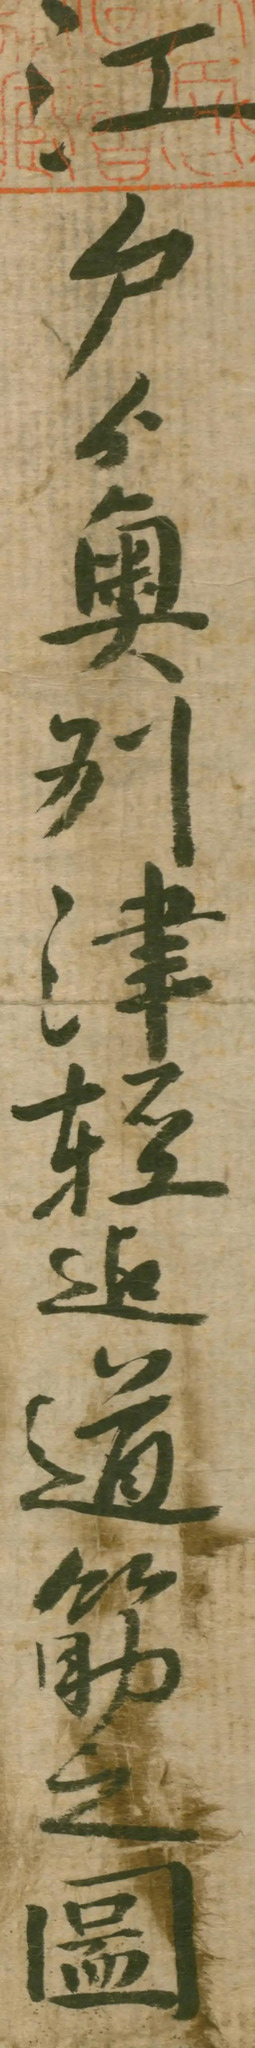江戸より奥州津軽迄道筋之図

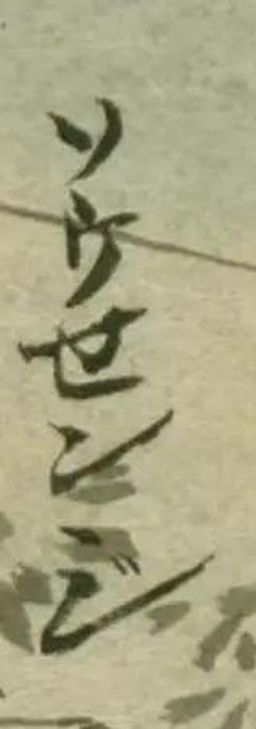ソウセンジ
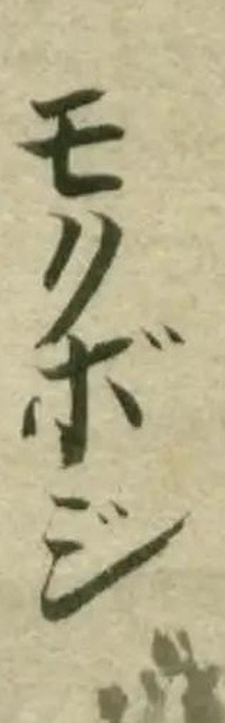モクボジ
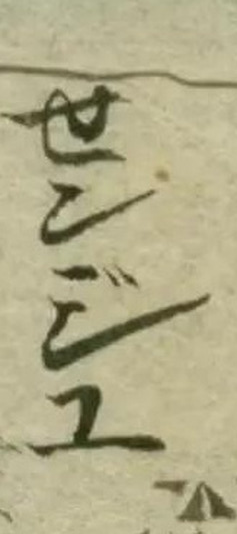センジュ
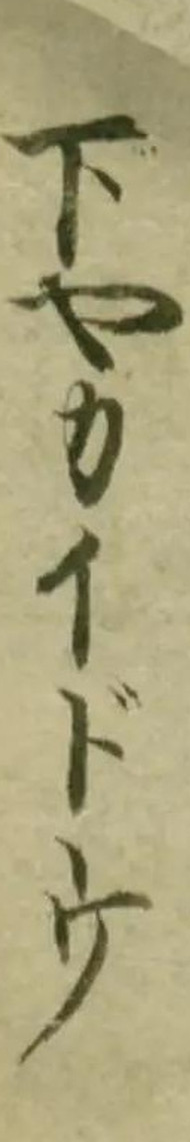下ヤカイドウ
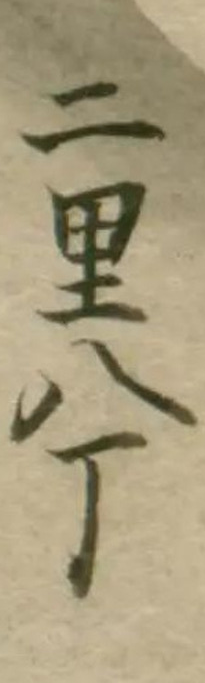二里八丁

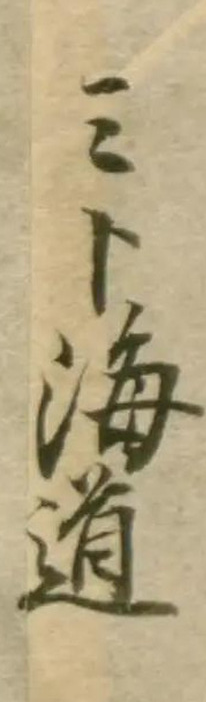ミト海道
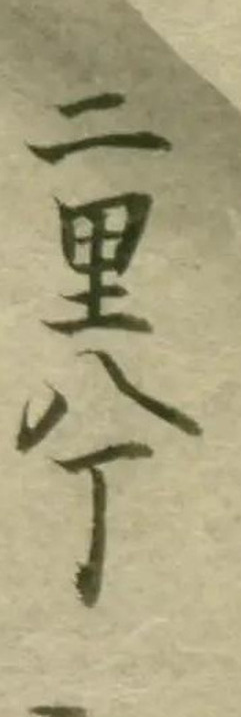二里八丁
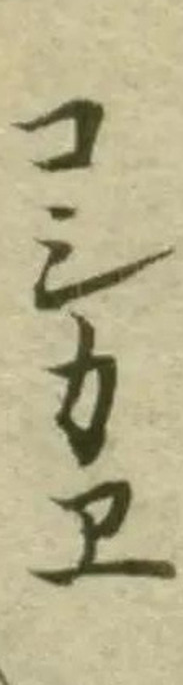コシカヱ

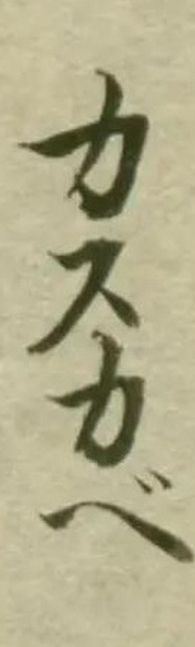カスカベ
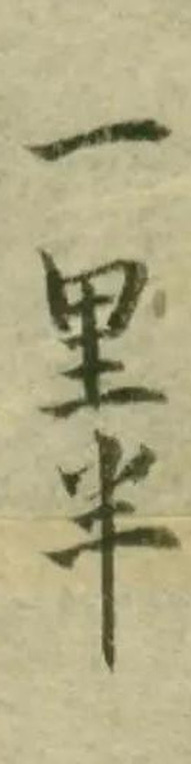一里半
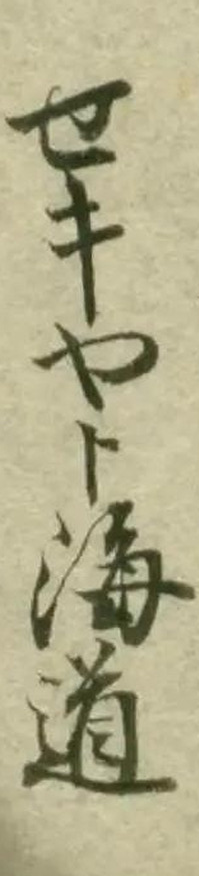セキヤト海道
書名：江戸より奥州津輕迄道筋之圖
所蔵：国立国会図書館 National Diet Library, JAPAN
